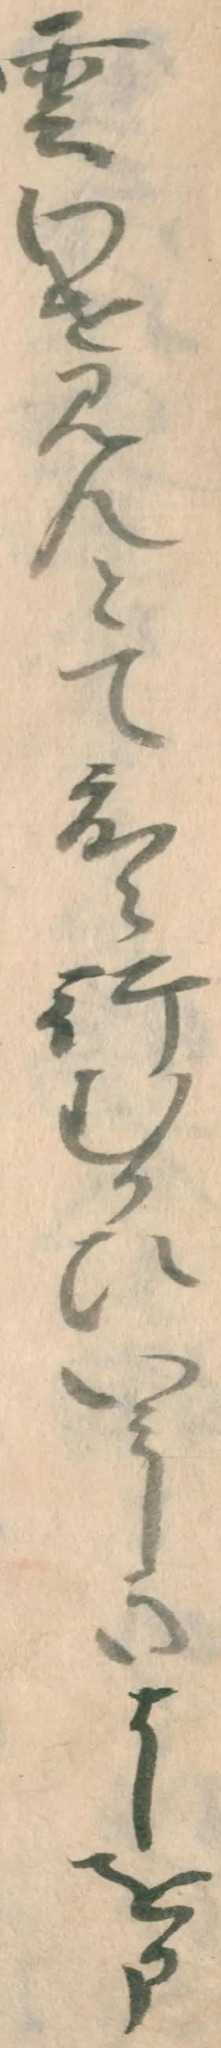雲わけ見んとて度々行むかひいみしきよしを申
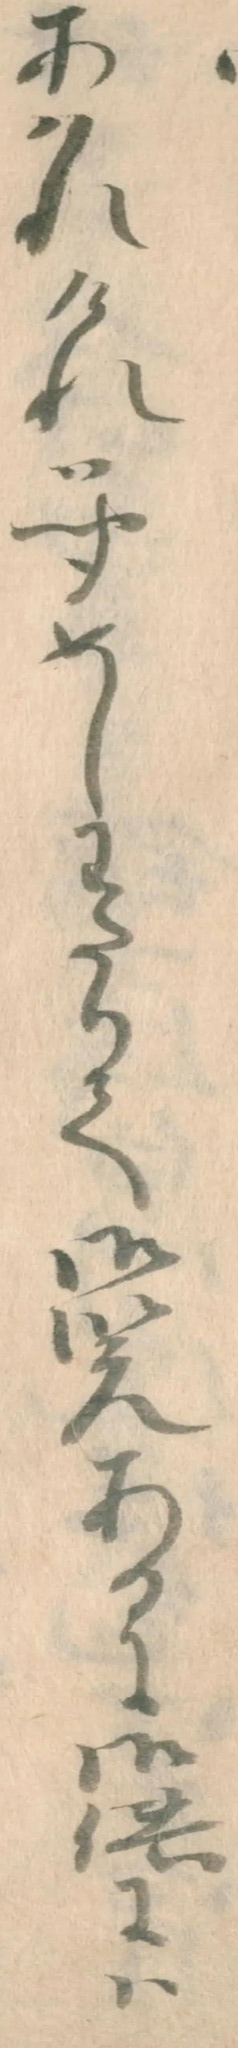あはれけれは聞めしわたりて御覧あるに御供には
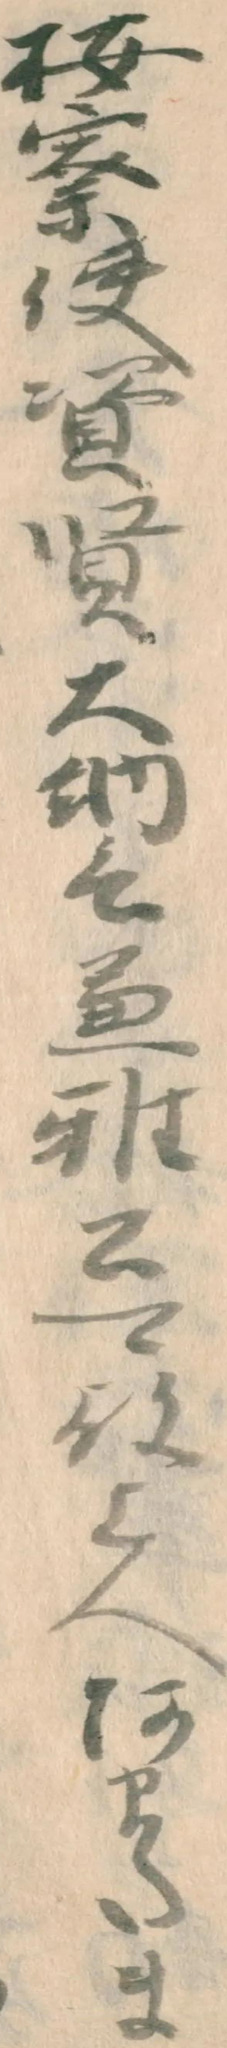按察使資賢大納言兼雅公卿殿上人あまたま
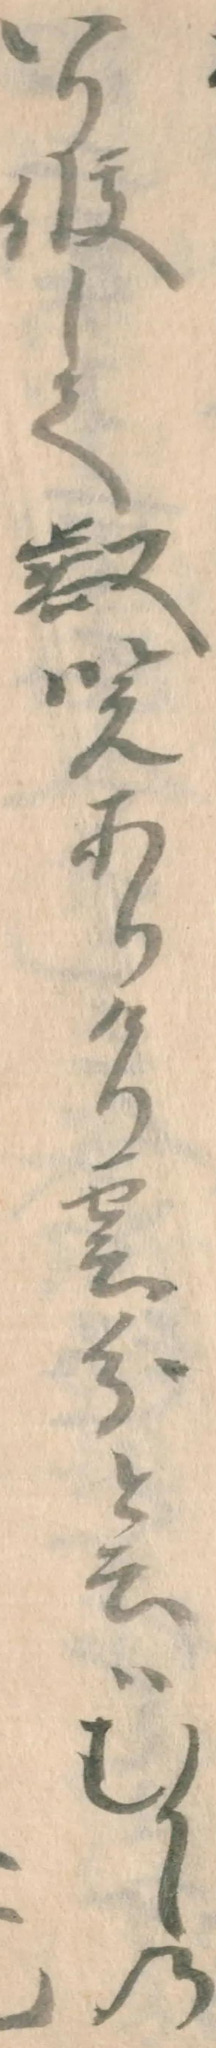いり候して叡覧ありけり雲分と云はむかしの
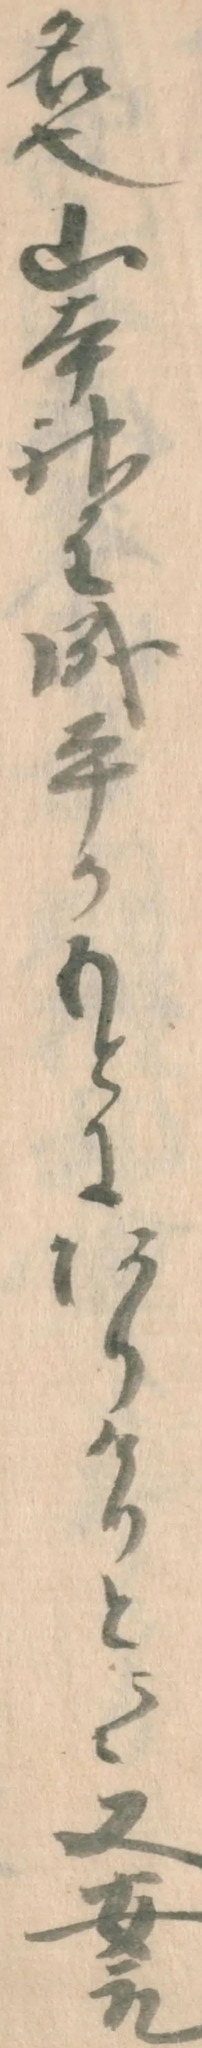名也山本神主成平かもとにありけりと云々又安元
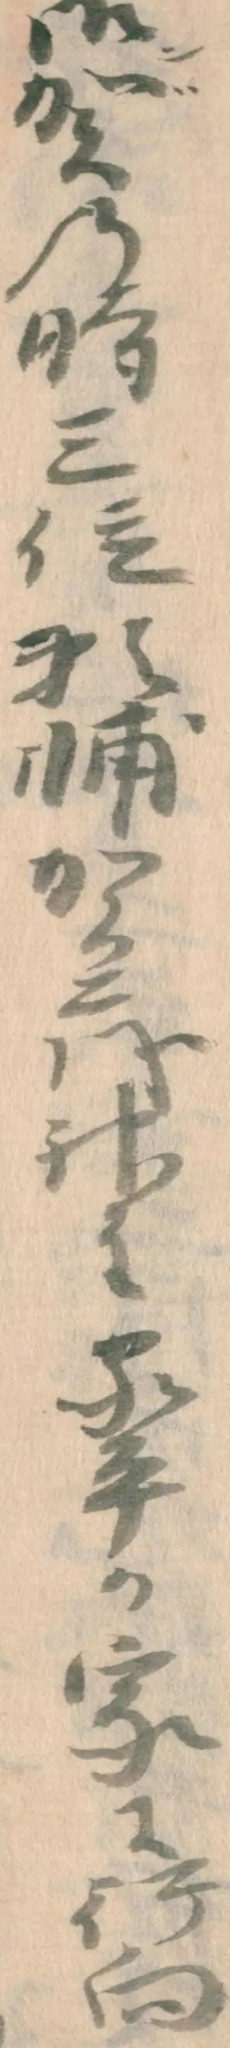御賀の時三位頼輔賀茂神主家平の家に行向
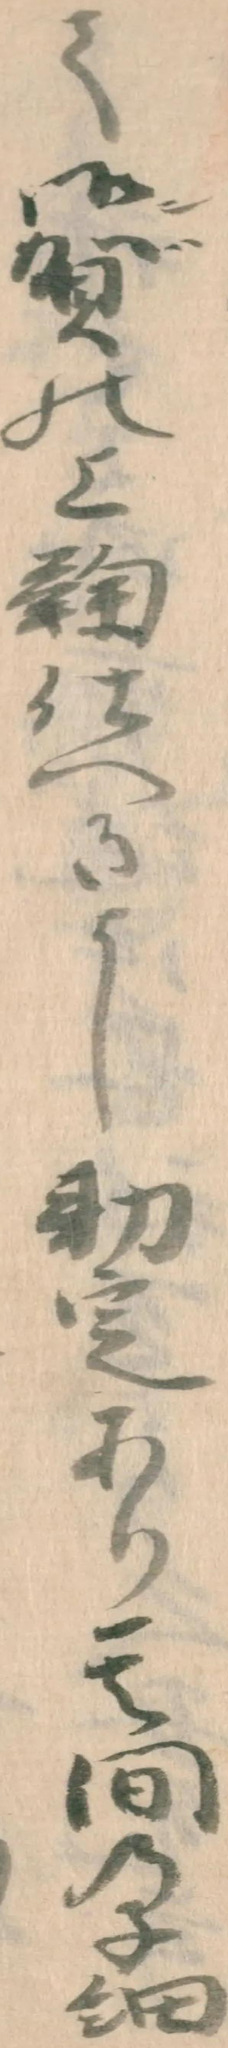て御賀の上鞠仕へきよし勅定あり其間の子細
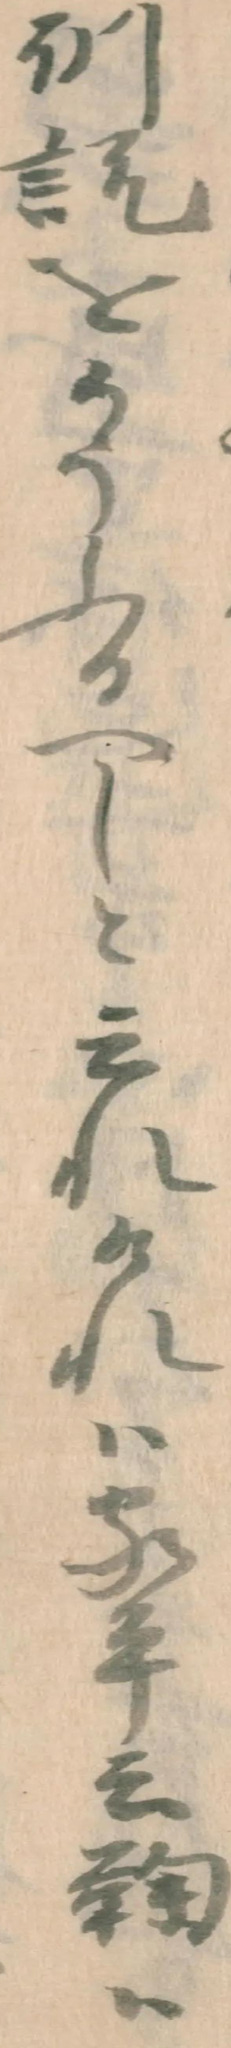訓説をかうふるへしと云れけれは家平云鞠は
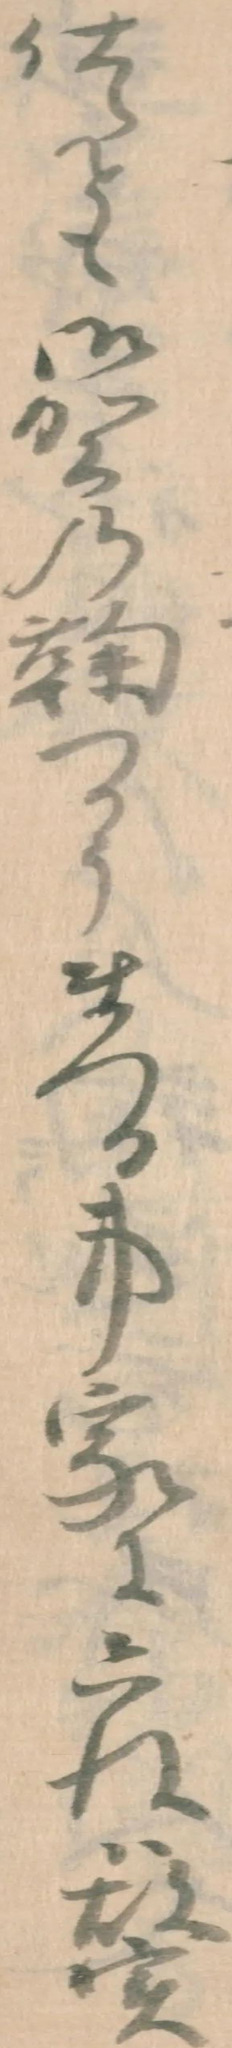仕候とも御賀の鞠つかうまつる事家に候はねは故実
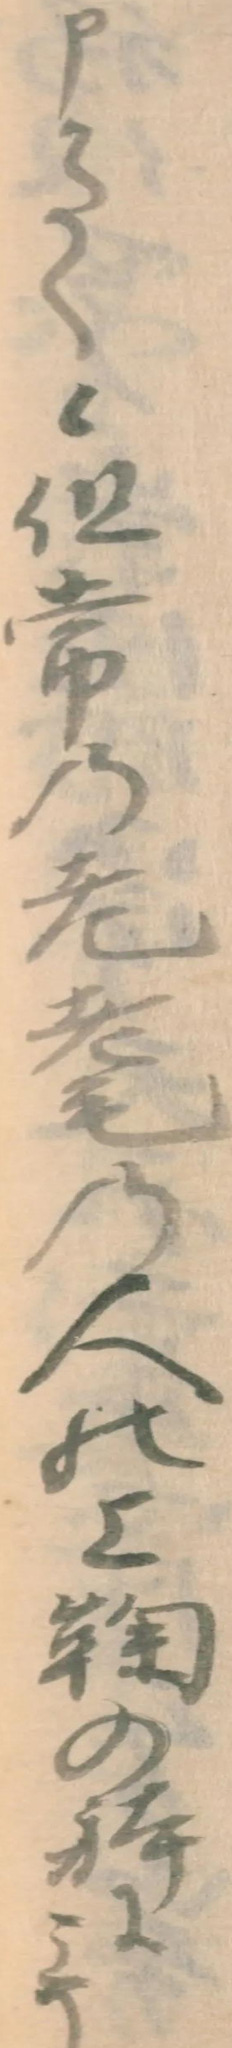申かたく候但常の老耄の人の上鞠の体にこそ
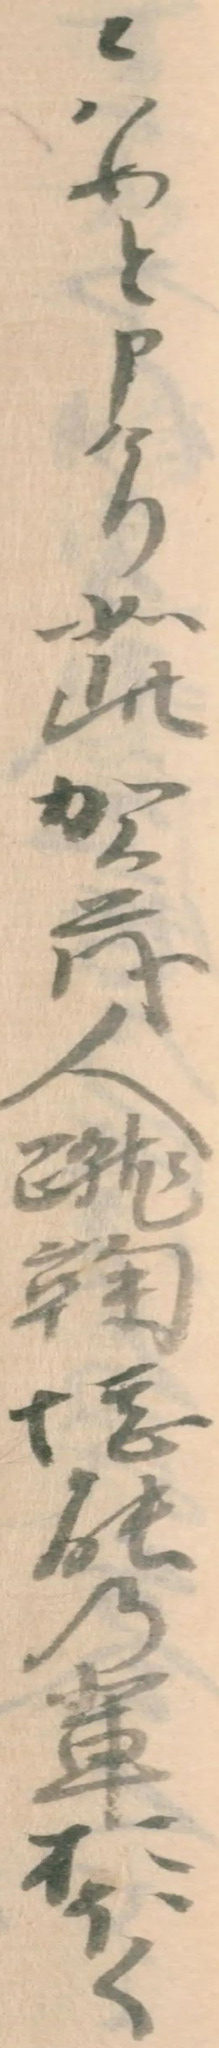候はめと申けり如此賀茂人蹴鞠堪能の輩おほく
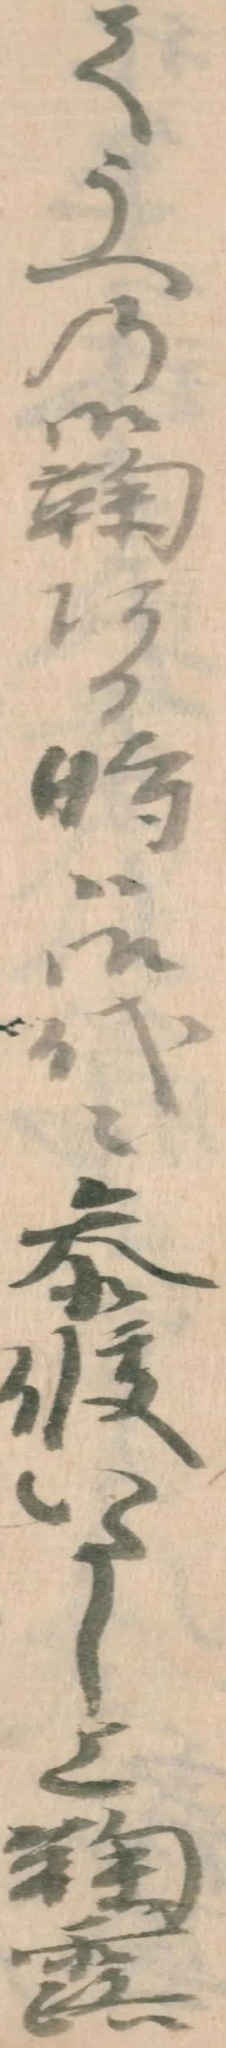てうへの御鞠ある時は御代々参候いたし上鞠露
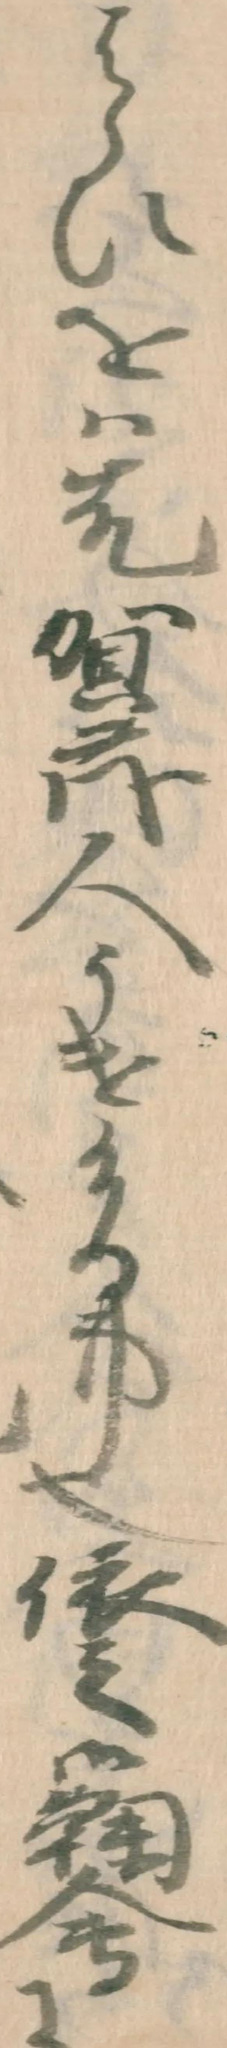はらひをは先賀茂人うけ給る事也依之御鞠会に
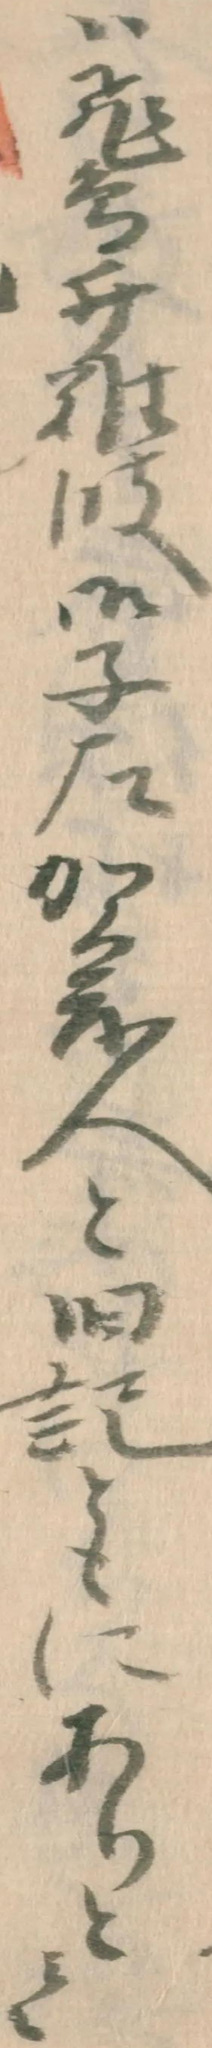は飛鳥井難波御子左賀茂人と旧記ともにありと云々
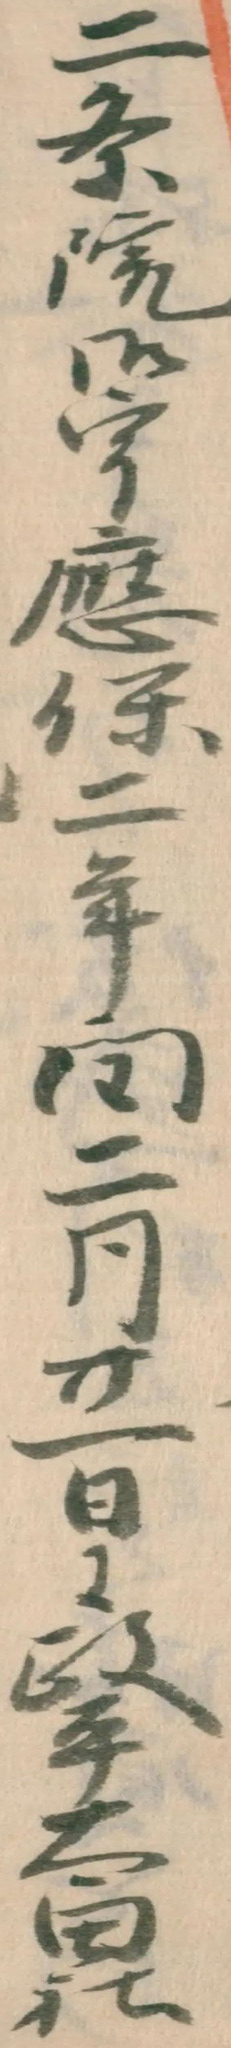二条院御宇応保二年閏二月廿一日に政平太田社
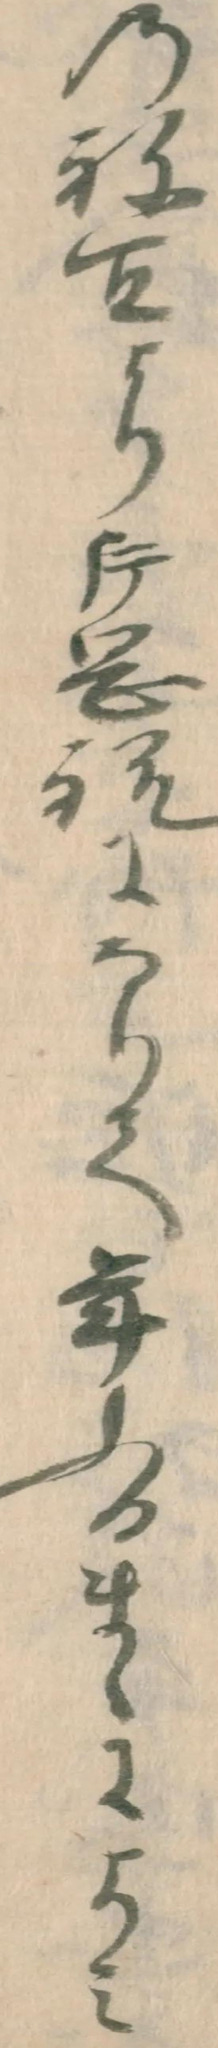の祢宜より片岡祝になりて年ふるまゝによみ
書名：賀茂社記録. 第1冊
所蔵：国立国会図書館 National Diet Library, JAPAN
